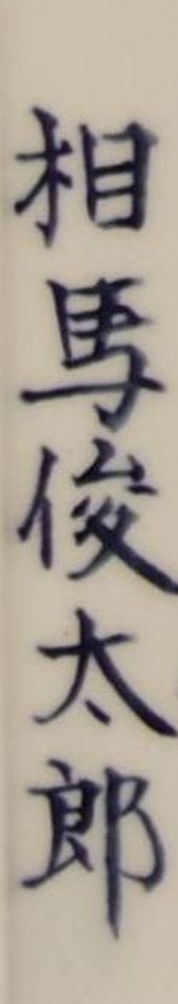相馬俊太郎

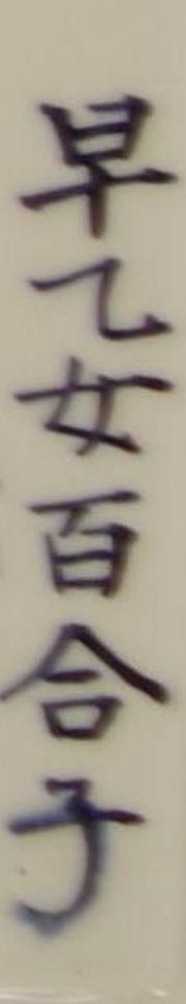早乙女百合子
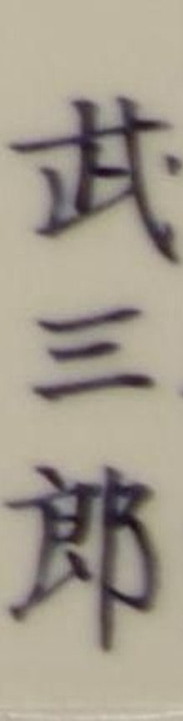武三郎
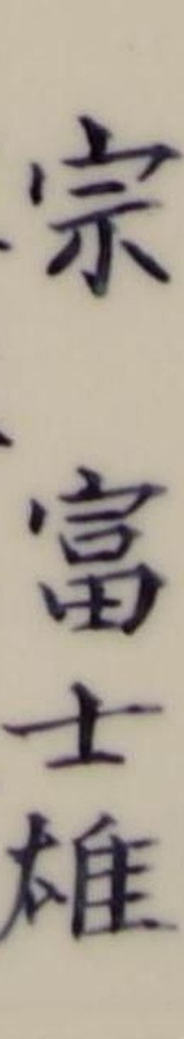宗富士雄
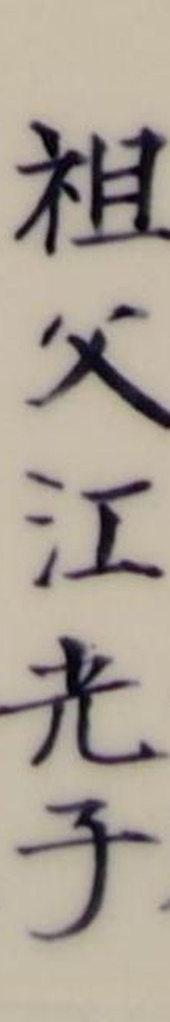祖父江光子
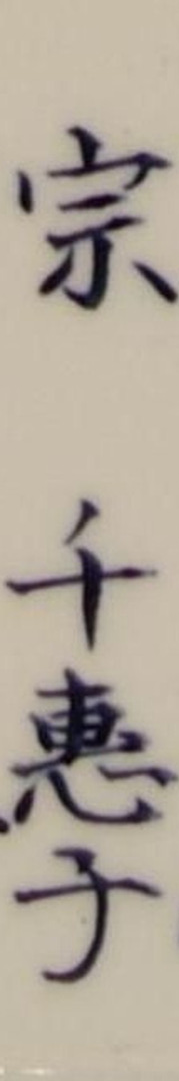宗千恵子
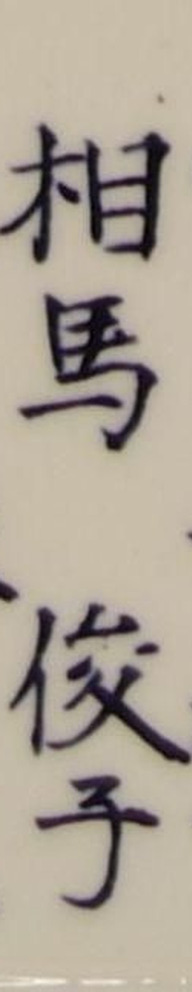相馬俊子

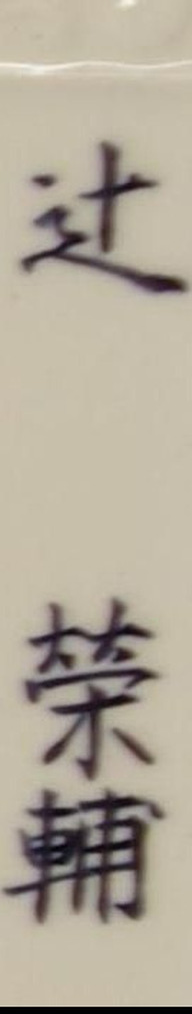辻榮輔
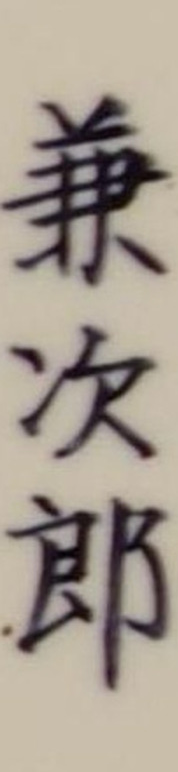兼次郎
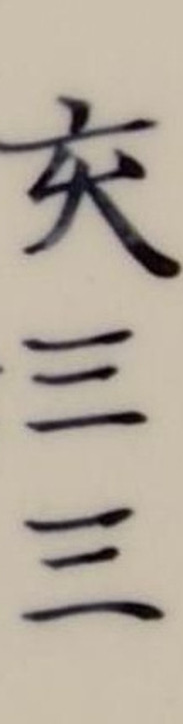亥三三
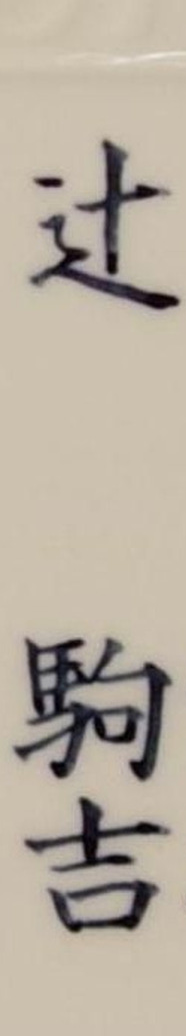辻駒吉
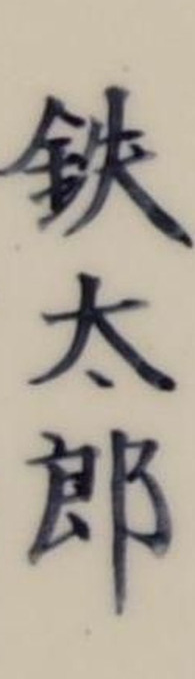鉄太郎
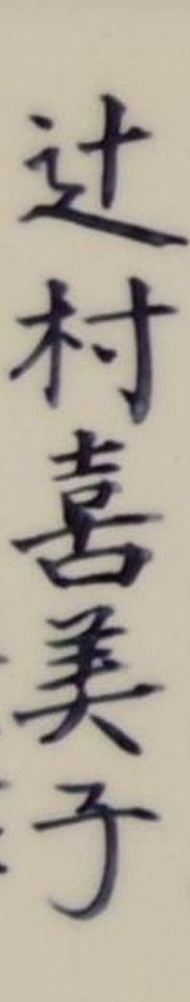辻村喜美子

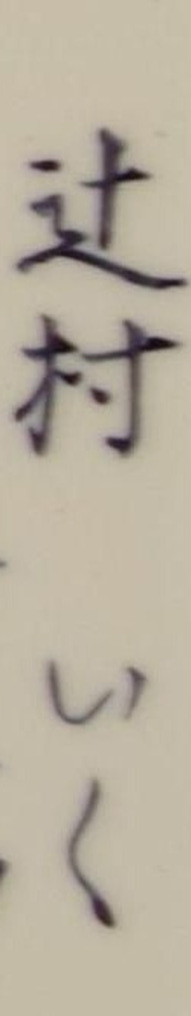辻村いく
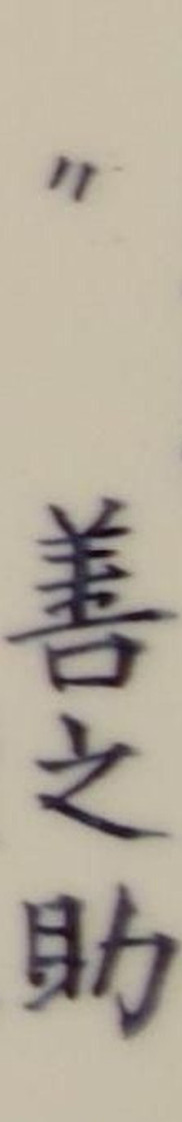善之助
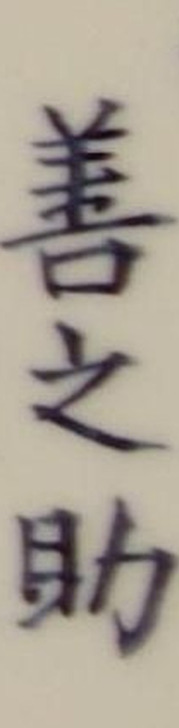善之助
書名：E~L
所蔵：高野山金剛峯寺
